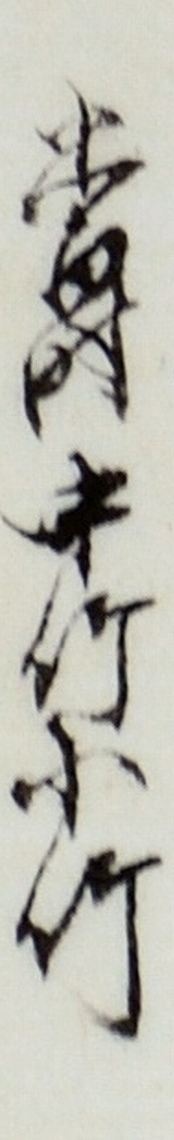当時中竹小竹

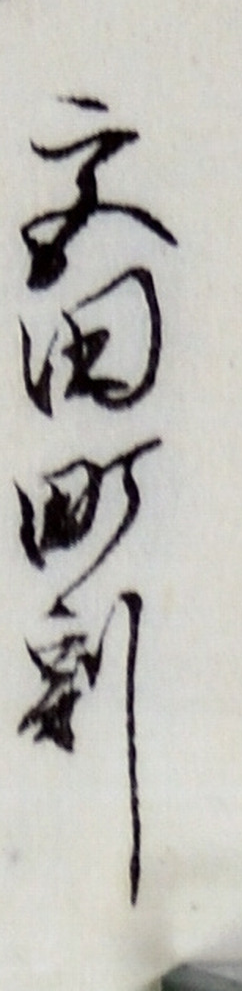宮田町割
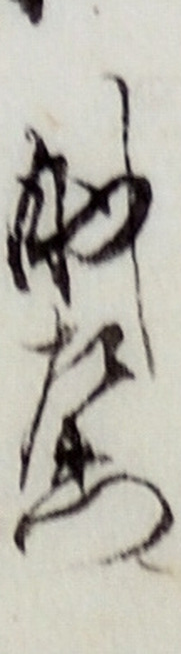藤左衛門
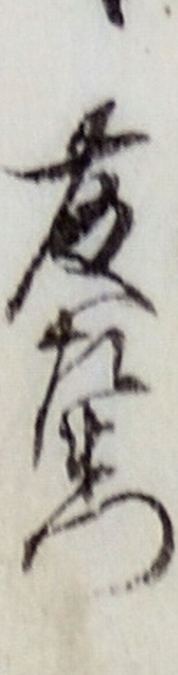藤左衛門
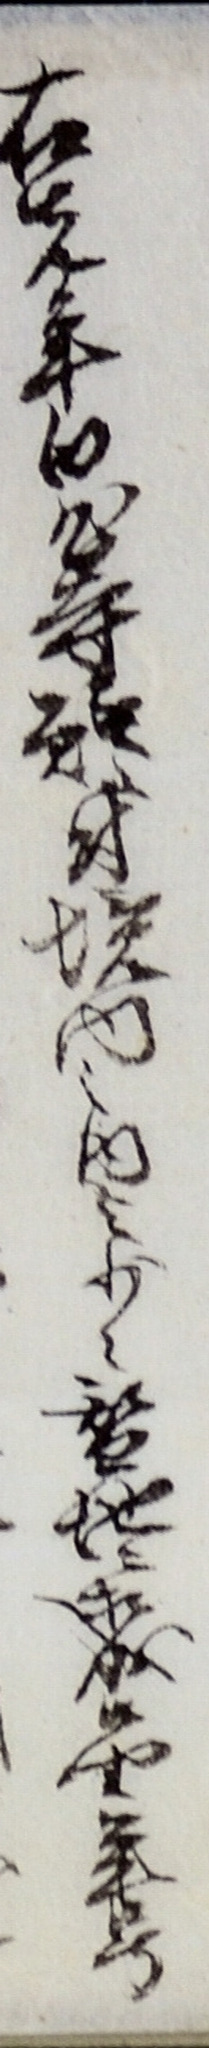右先年白心寺願ニ付境内之内と少々替地ニ相成候由年号
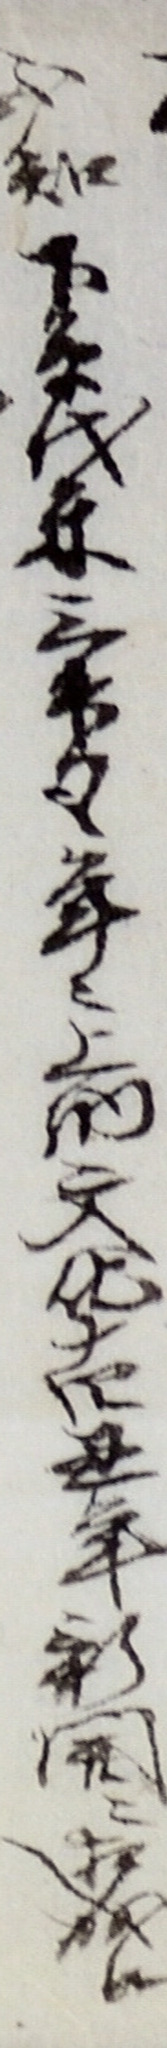不知下草代米三升ツヽ年々上納文化十四丑年新開ニ相成候
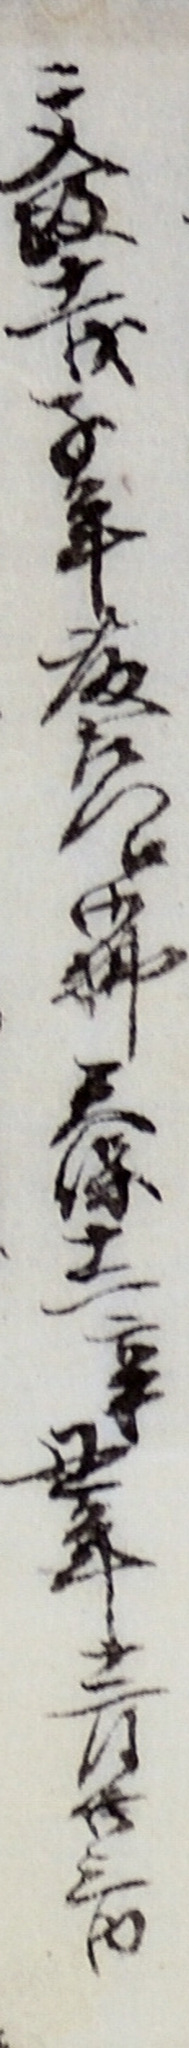文政十一戌子年藤左衛門え御払天保十二辛丑年十二月廿三日
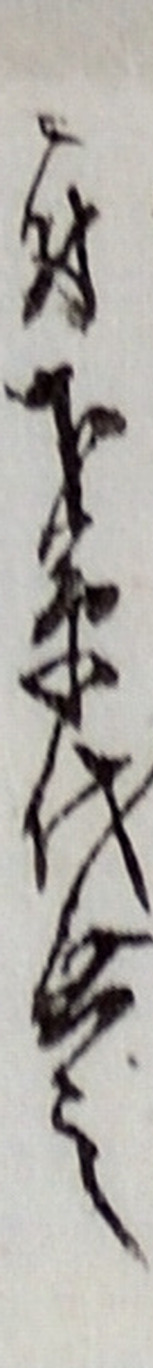ニ付下草代無之
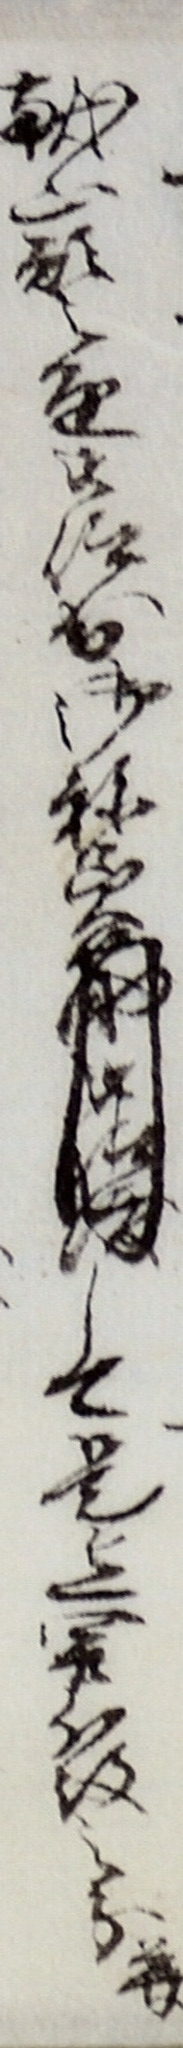献山願之通被仰出御称美して是迄開発之分并
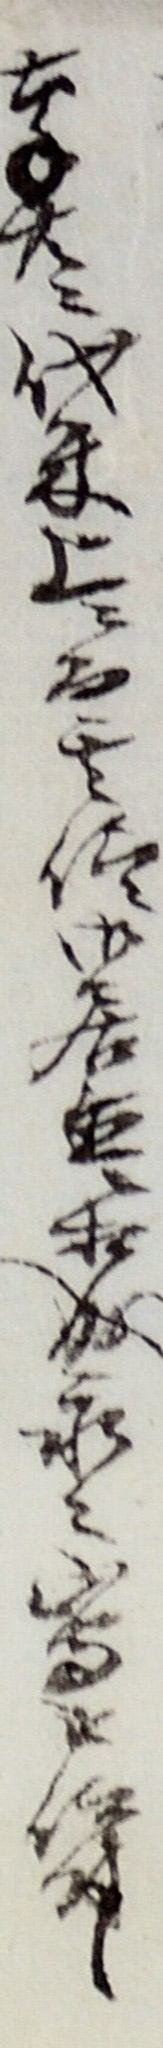土手共ニ代米上ニ而其侭御居置ニ相成永々山守被仰付候
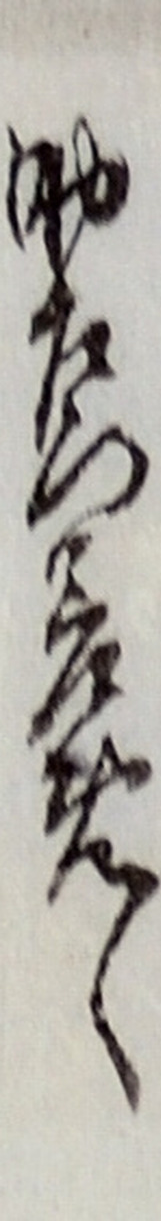助左衛門差免候
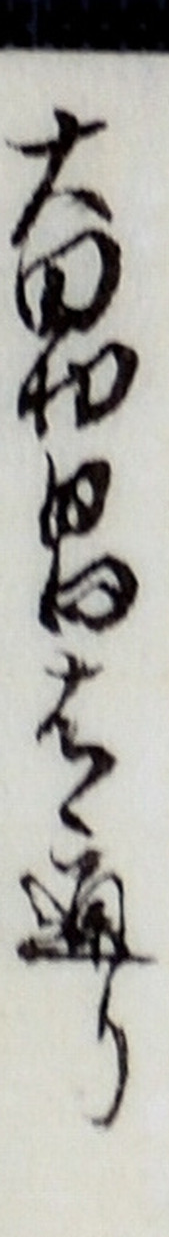大田切日向はゝ通り
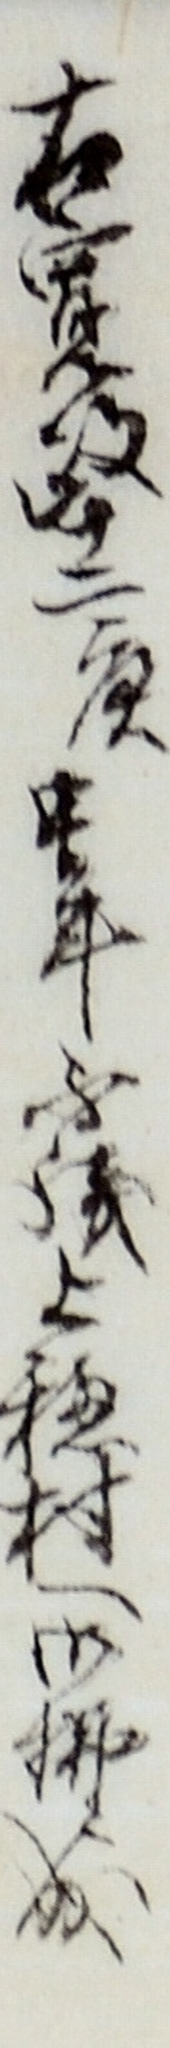右寛政十二庚申年不残上穂村へ御払ニ成
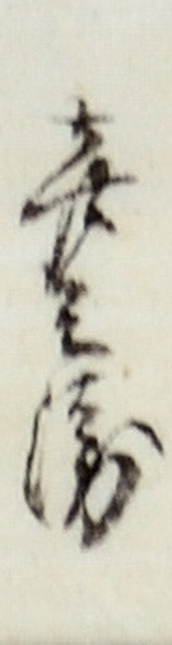喜兵衛
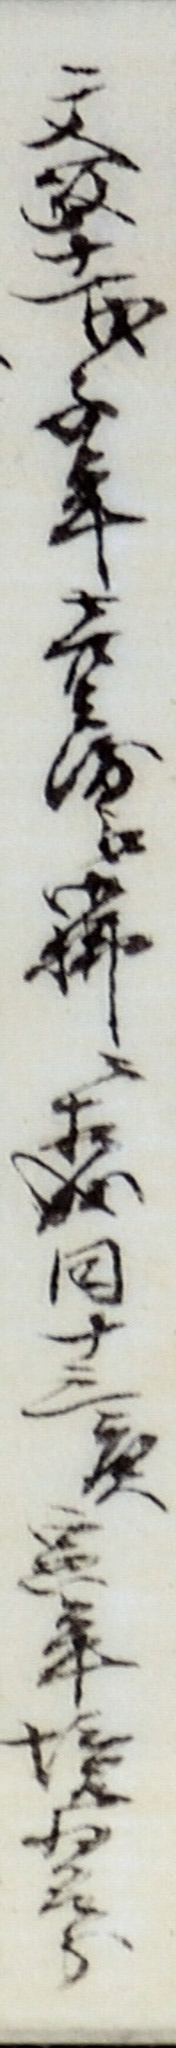文政十一戊子年喜兵衛え御払ニ相成同十三庚寅年境為見分
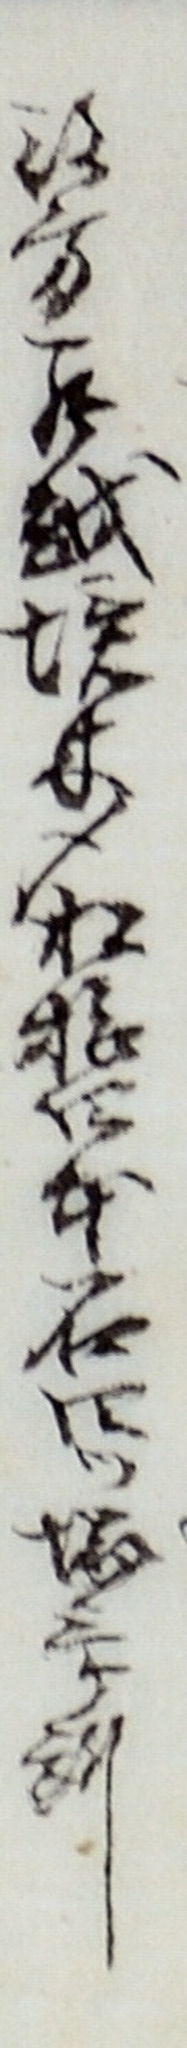役方罷越境木〆松拾四本石四ツ塚三ケ所
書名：山林帳草稿
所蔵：伊那市立高遠町図書館・合同会社AMANE
